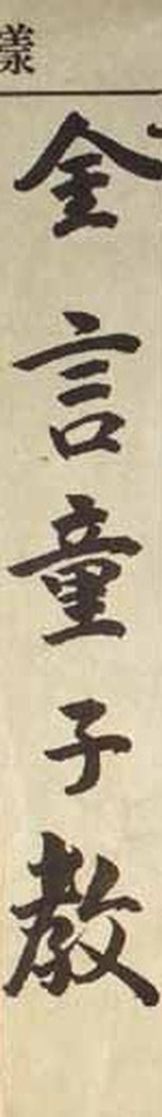金言童子教

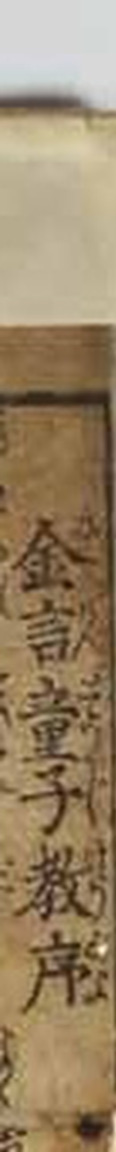金言童子教序
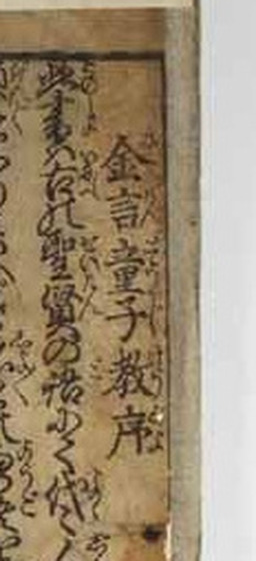金言童子教序
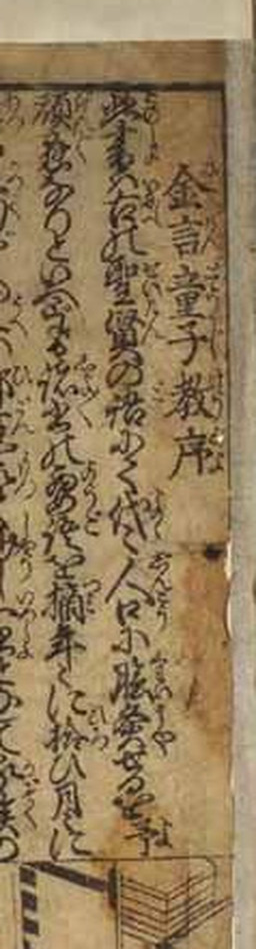此書は古の聖賢の語にて代々人口に膾炙せるを予
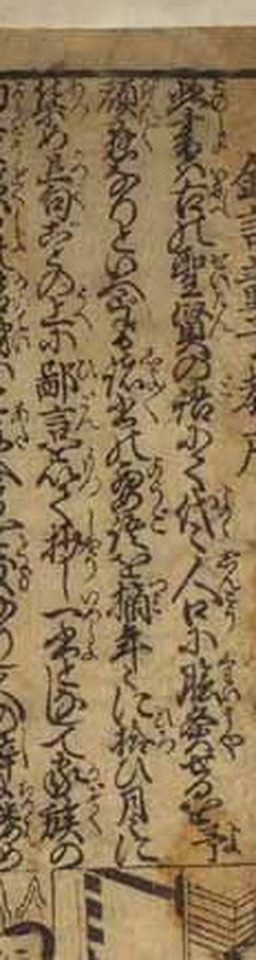頑愚なりといへども諸書の要語を摘年々に拾ひ月々に
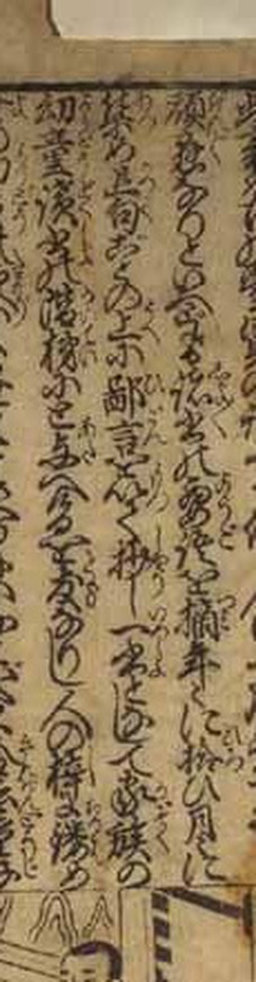集め且句ごとの上に鄙言を以て抄し一書となして家族の
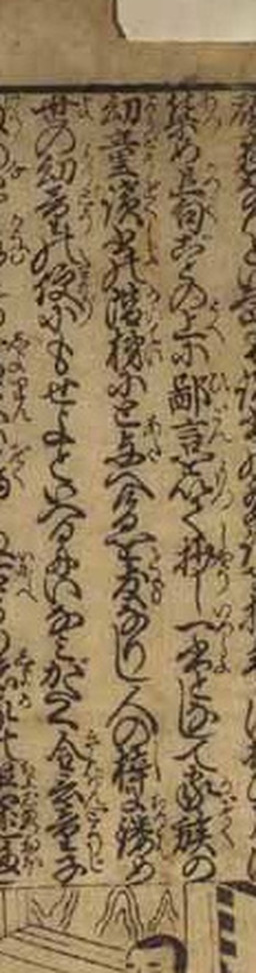幼童読書の階梯にと与へけるを友なりし人の梓に鏤め
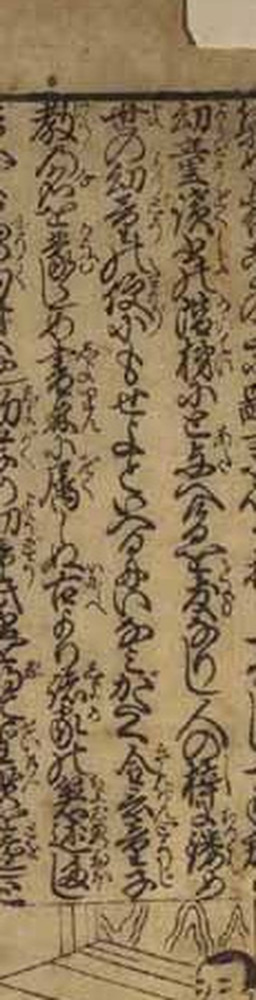世の幼童の便にもせよといへるにいなみがたく金言童子
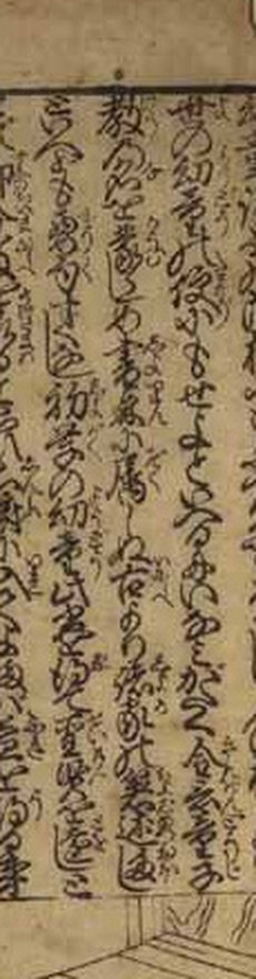教の名を蒙らしめ書林に属しぬ古より諸家の著述多し
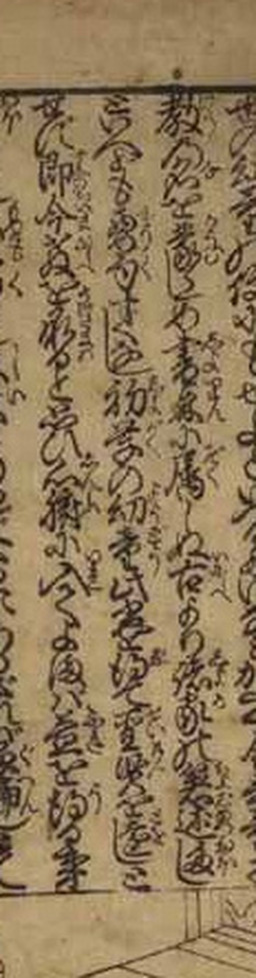といへども要句すくなし初学の幼童此書を得て聖賢を遠しと
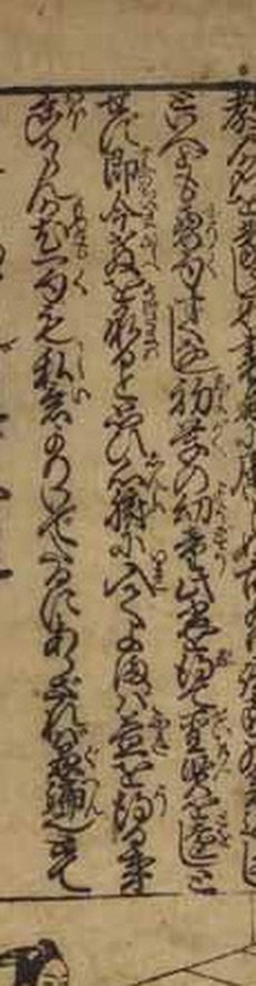せず即今教を承ると思ひ心腑に入てよまば益を得る事
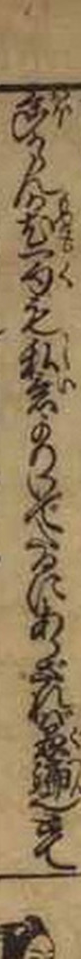多からんか尤一句も私意よりいでたるにあらざれば愚編也とて
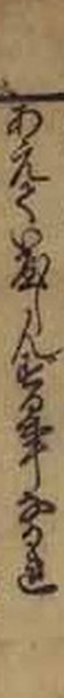あえていやしんとする事なかれ
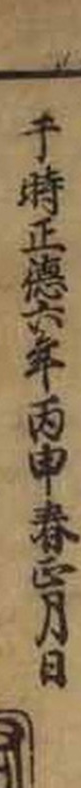于時正徳六年丙申春正月日
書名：金言童子教〔竝抄〕
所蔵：東京学芸大学附属図書館
